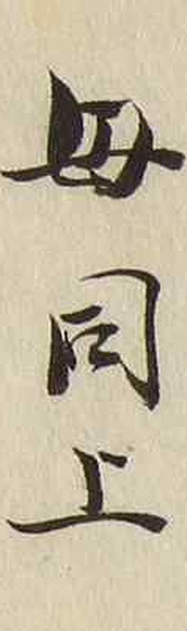母同上

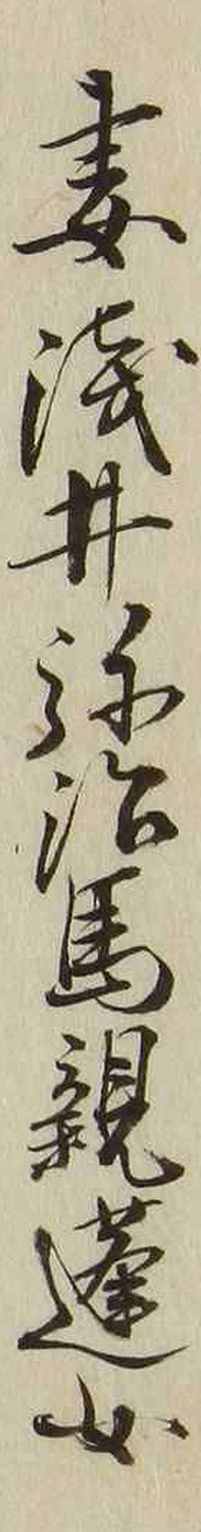妻浅井弥治馬親蓬女
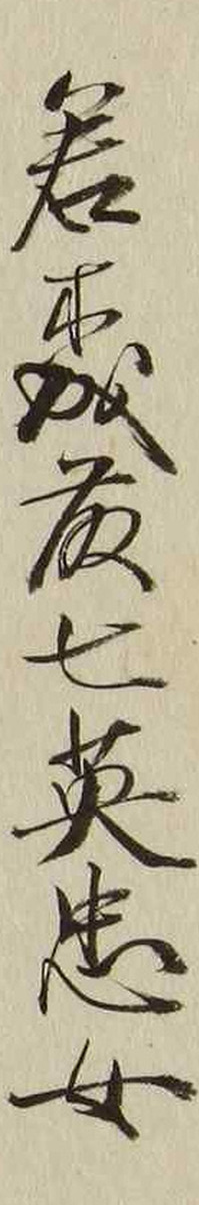若森藤七英忠女
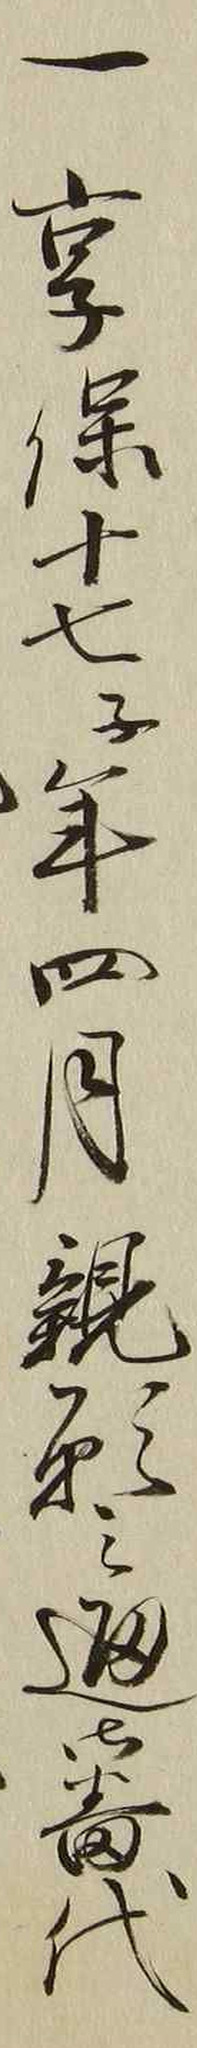一享保十七子年四月親願之通御番代
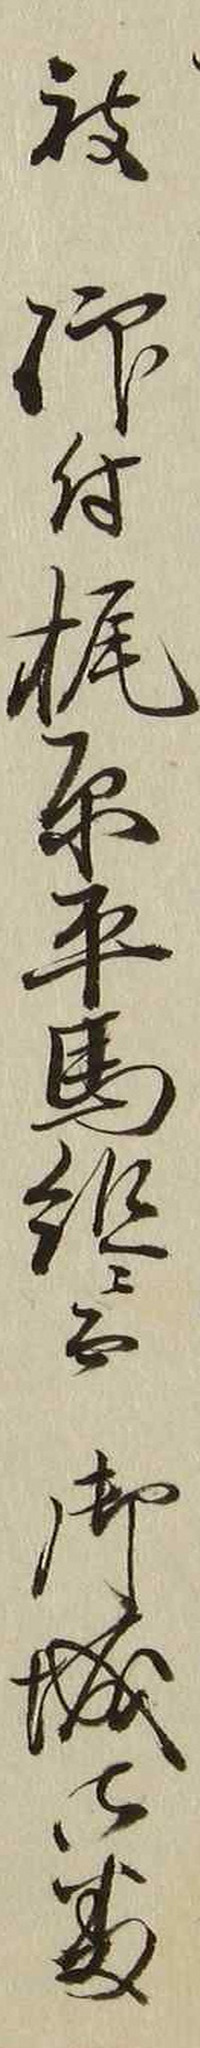被仰付梶原平馬組に而御城御番
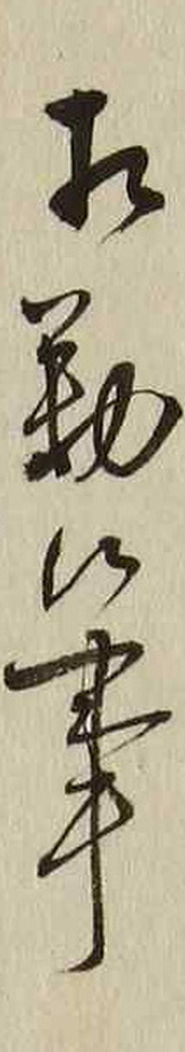相勤候事
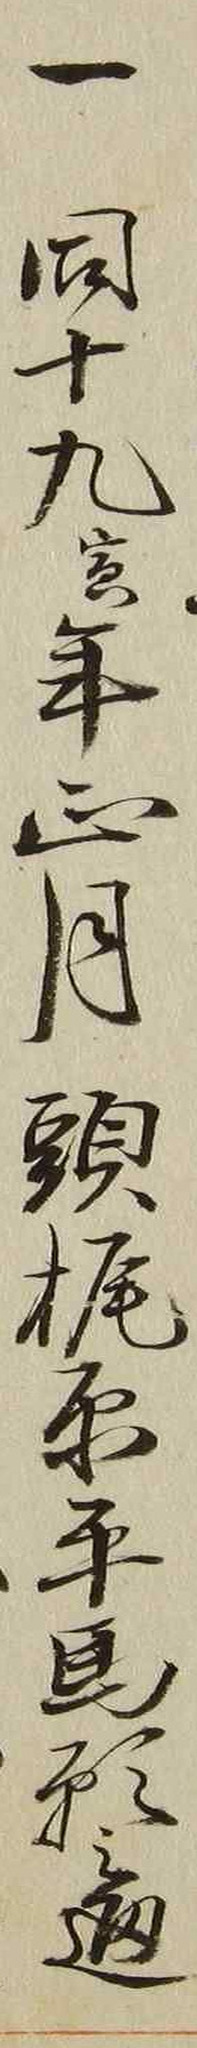一同十九寅年正月頭梶原平馬願之通
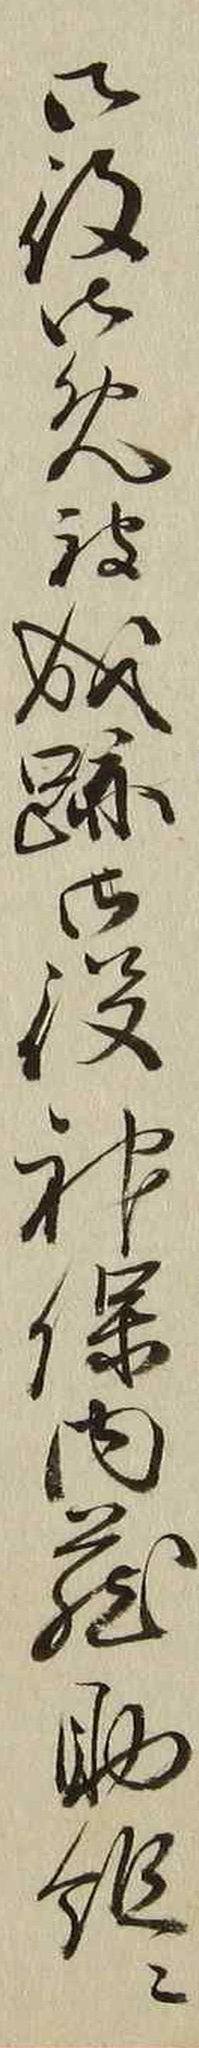御役御免被成跡御役神保内蔵助組に
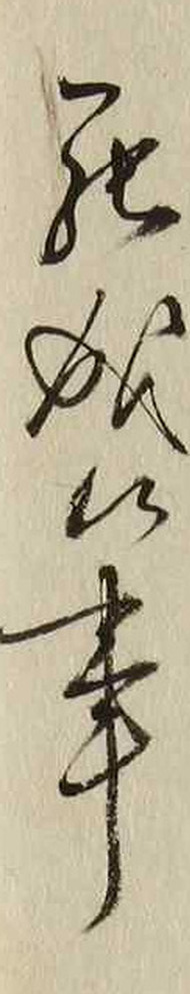罷成候事
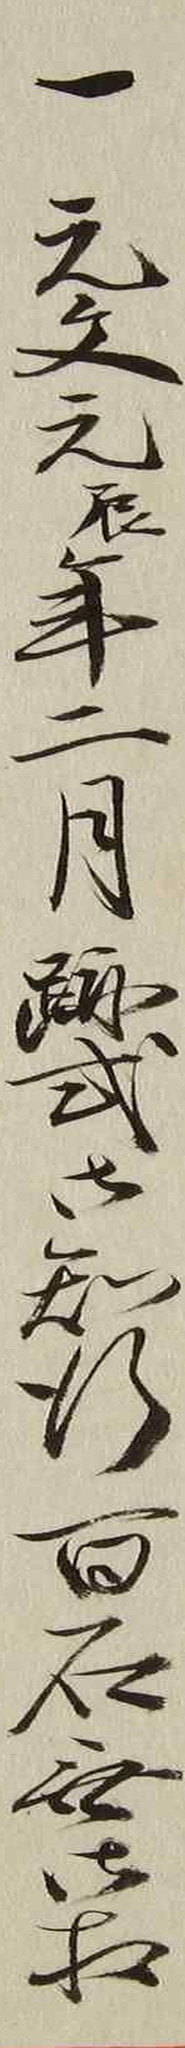一元文元辰年二月跡式御知行百石無御相
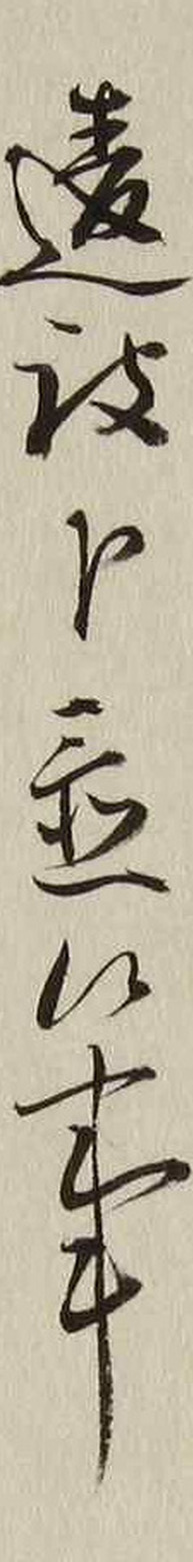違被下置候事
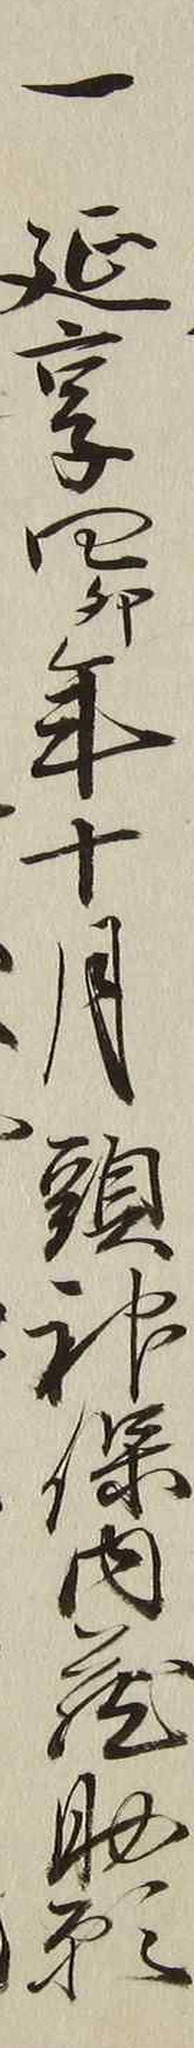一延享四卯年十月頭神保内蔵助願
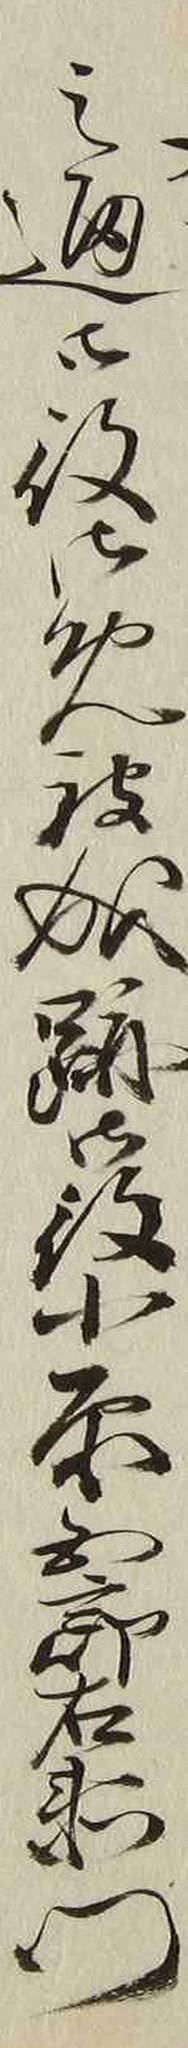之通御役御免被成跡御役小原五郎右衛門
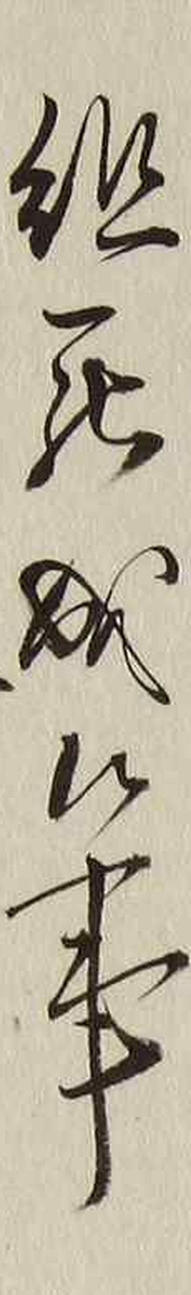組罷成候事
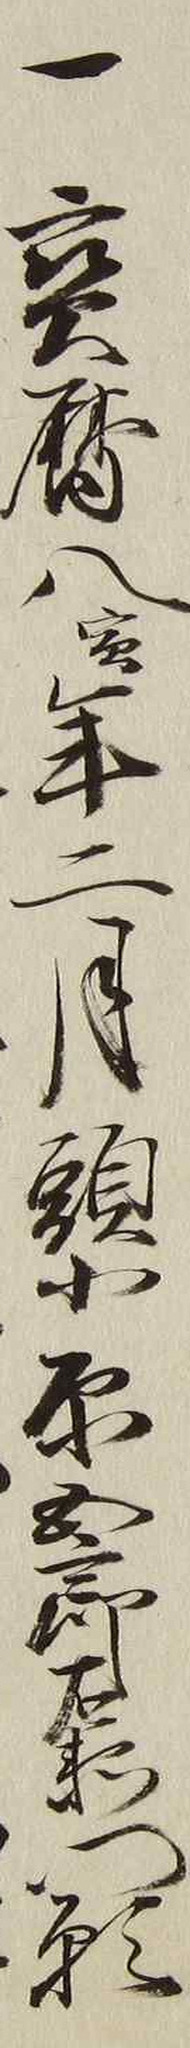一宝暦八寅年二月頭小原五郎右衛門願
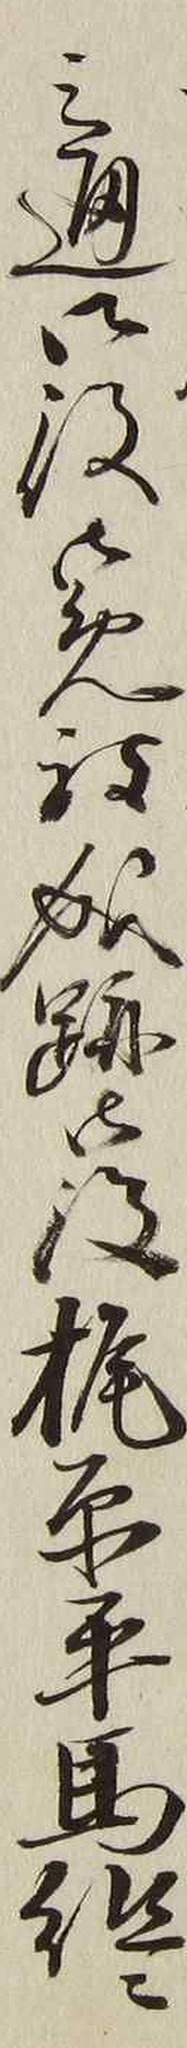之通御役御免被成跡御役梶原平馬組に
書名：諸士系譜　巻之157　ね之部1
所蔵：会津若松市立会津図書館
